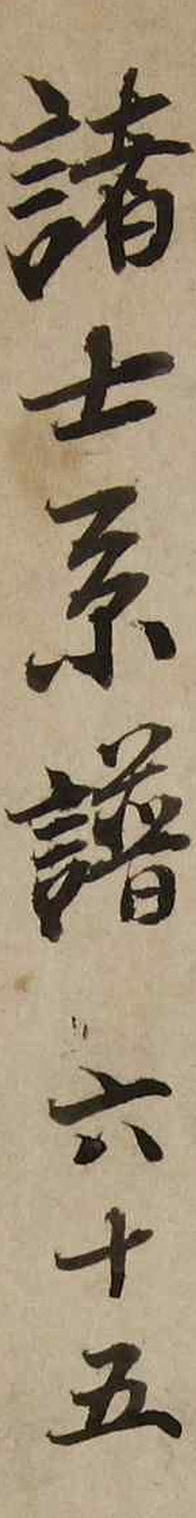諸士系譜六十五

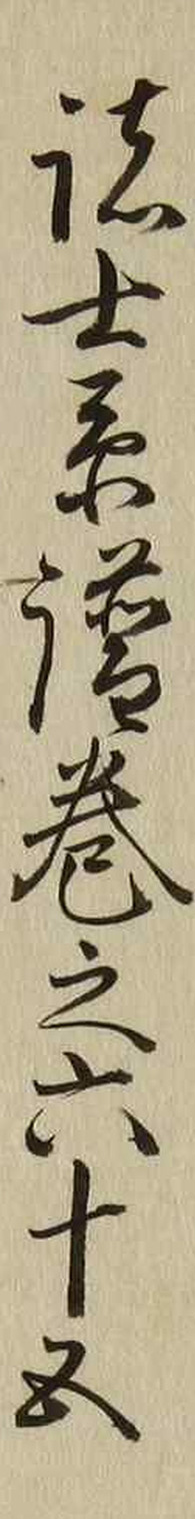諸士系譜巻之六十五
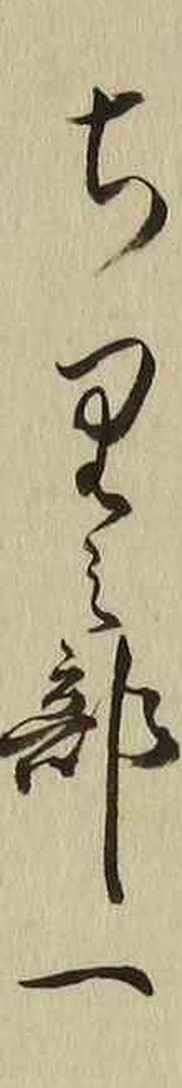ち里之部一
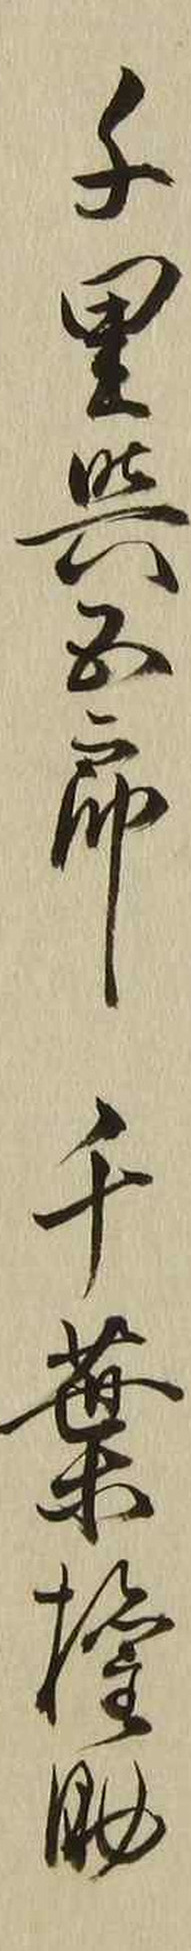千里與五郎千葉権助

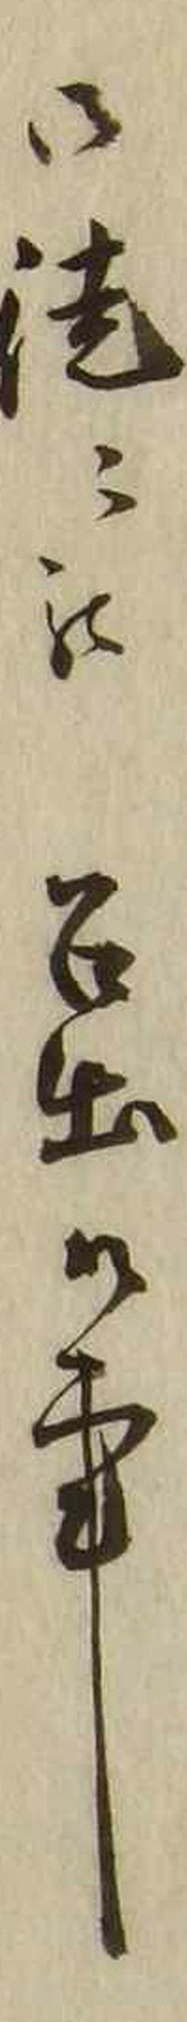御徒ニ召出候事
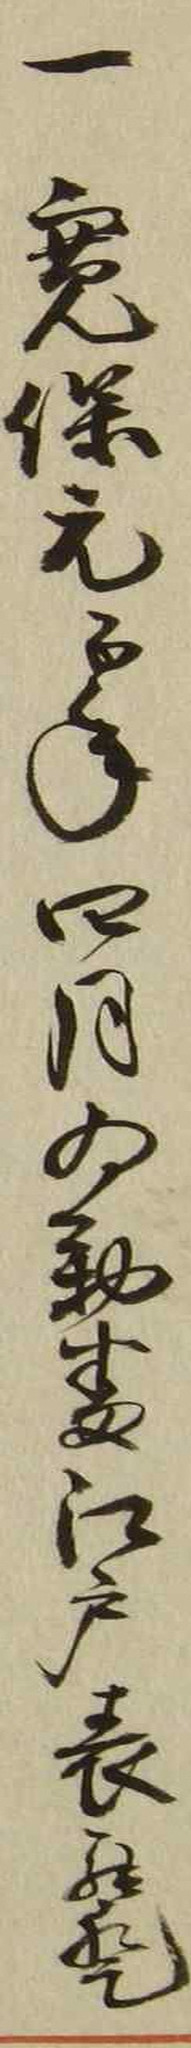一寛保元酉年四月為勤番江戸表罷登
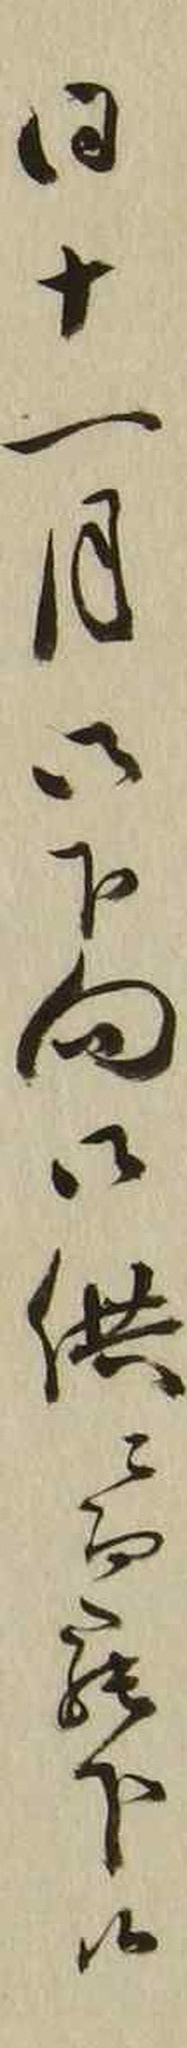同十一月御下向御供ニ而罷下候
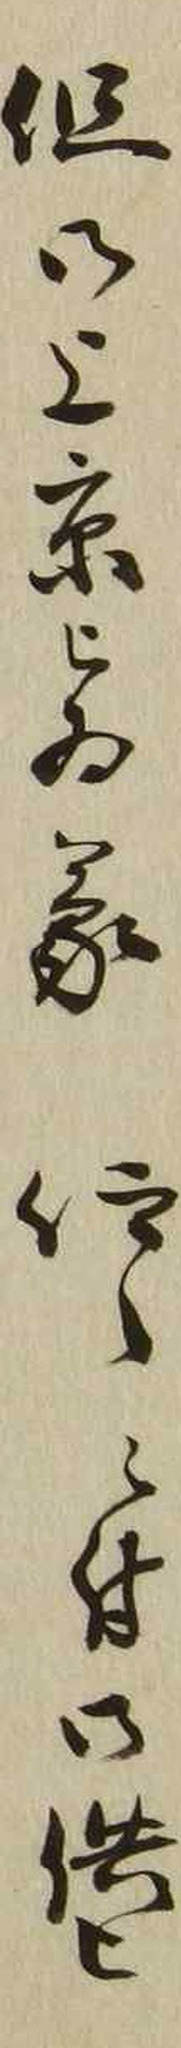但御上京被為蒙仰候ニ付御供被
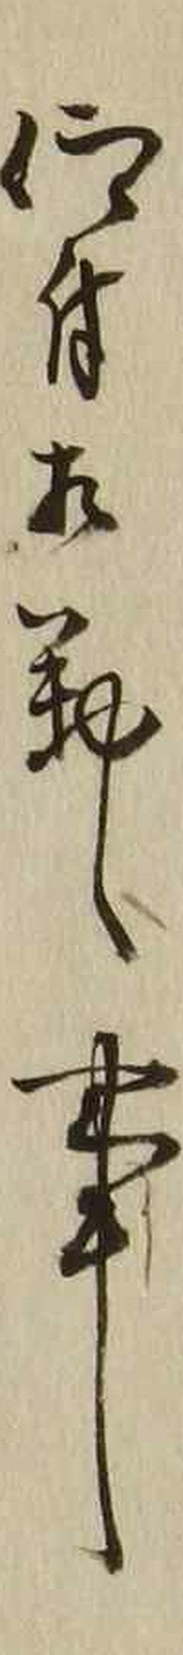仰付相勤候事
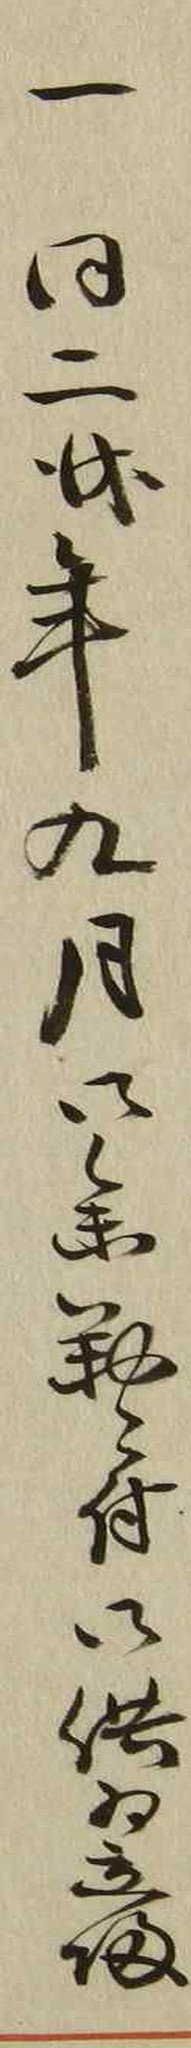一同ニ戌年九月御参勤ニ付御供為立帰
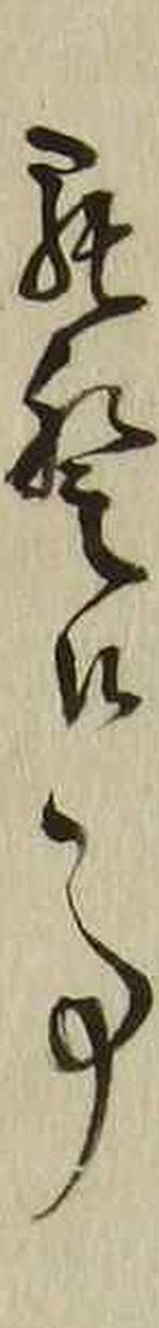罷登候事
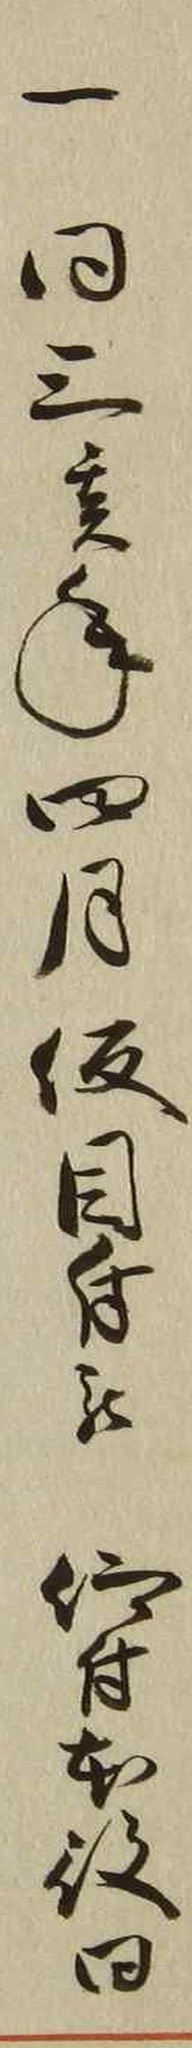一同三亥年四月仮目付被仰付本役同
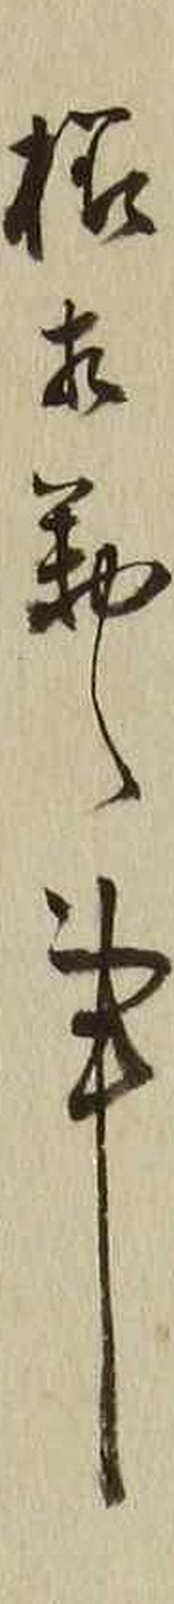様相勤候事
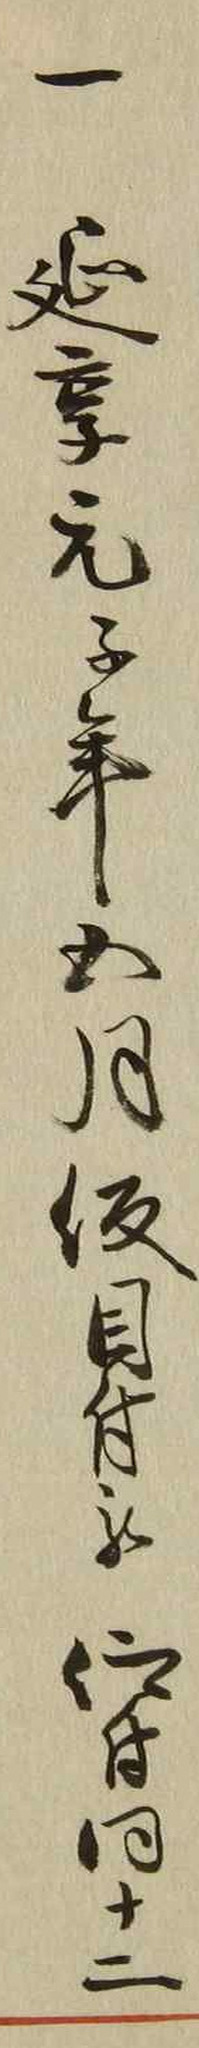一延享元子年五月仮目付被仰付同十二
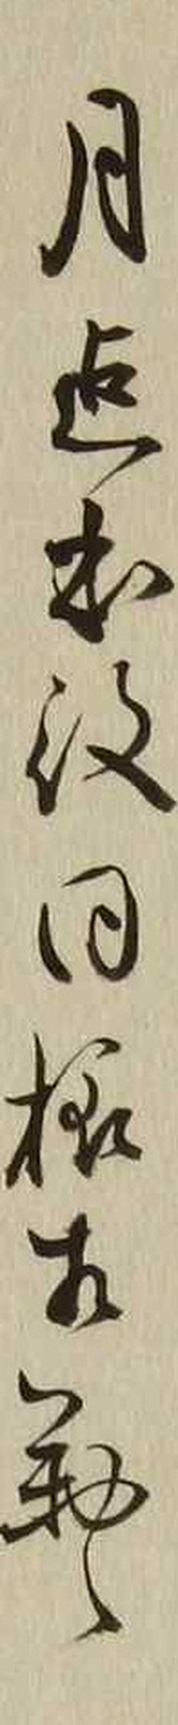月迄本役同様相勤候
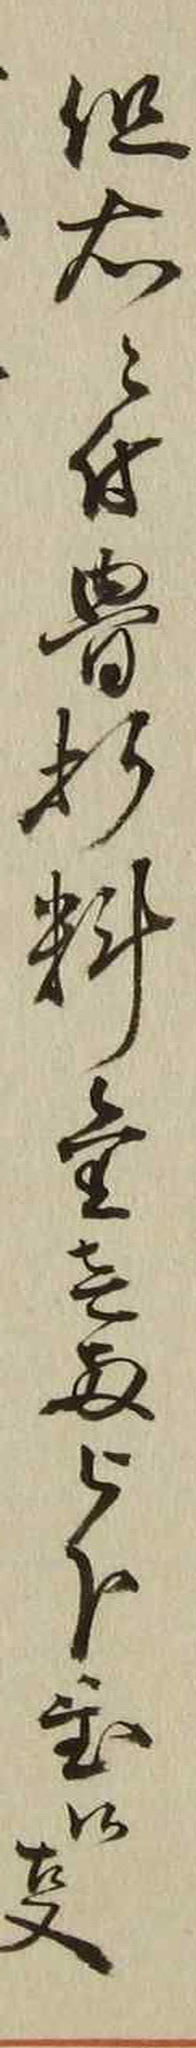但右ニ付骨折料金壱両被下置候事
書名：諸士系譜　巻之65　ち之部1
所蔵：会津若松市立会津図書館
